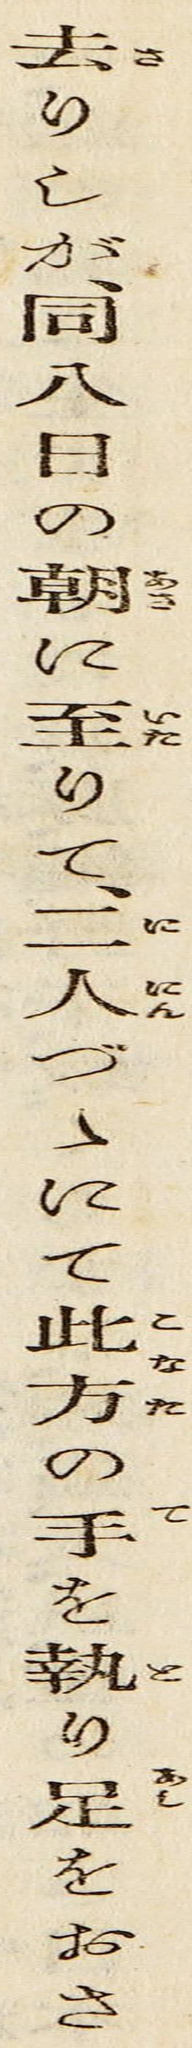去りしが、同八日の朝に至りて、二人づゝにて此方の手を執り足をおさ
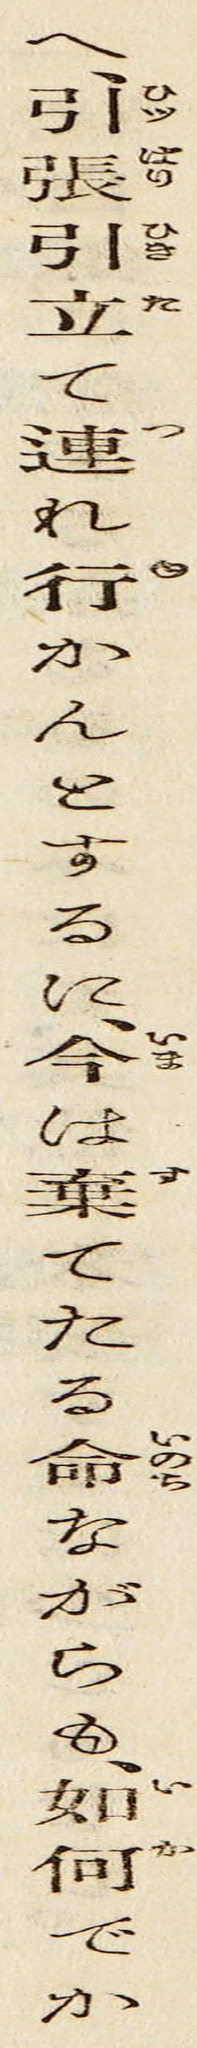へ、引張引立て連れ行かんとするに、今は棄てたる命ながらも、如何でか
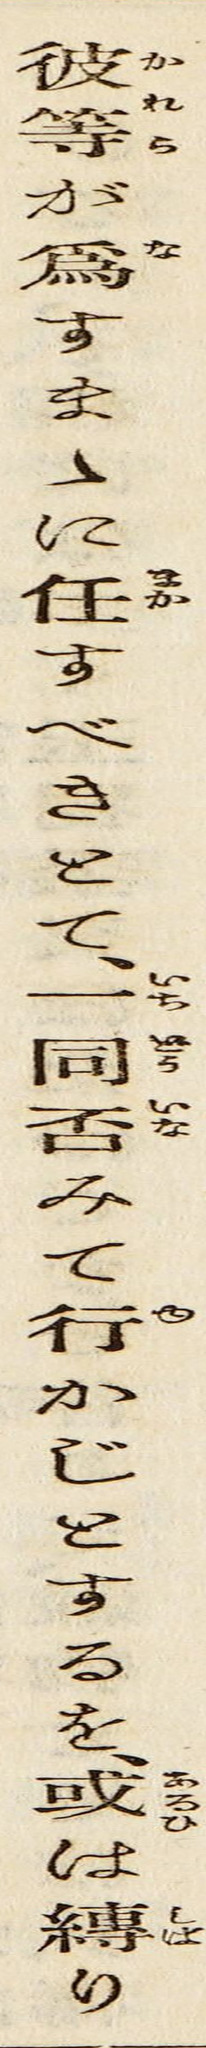彼等が為すまゝに任すべきとて、一同否みて行かじとするを、或は縛り
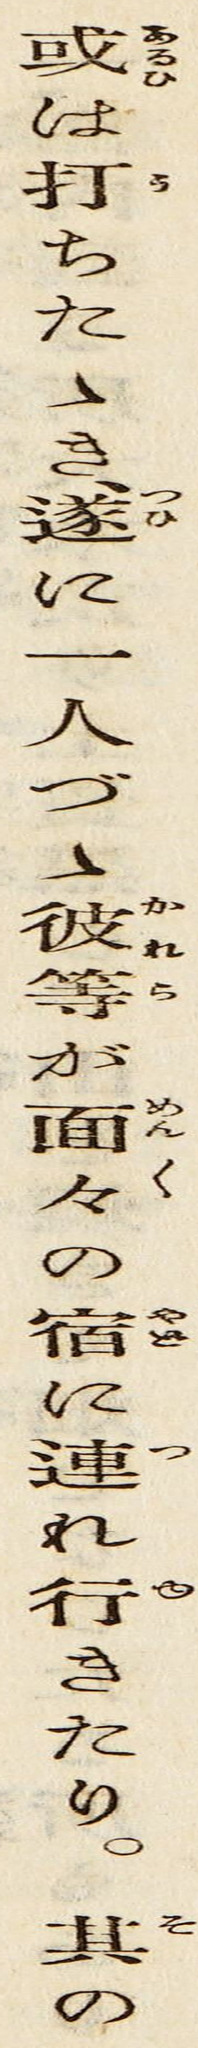或は打ちたゝき、遂に一人づゝ彼等が面々の宿に連れ行きたり。其の
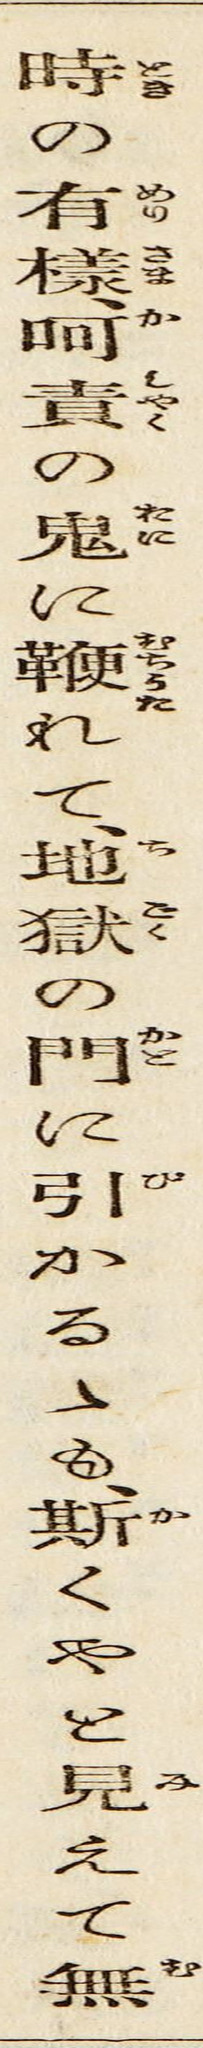時の有様、呵責の鬼に鞭れて、地獄の門に引かるゝも、斯くやと見えて無
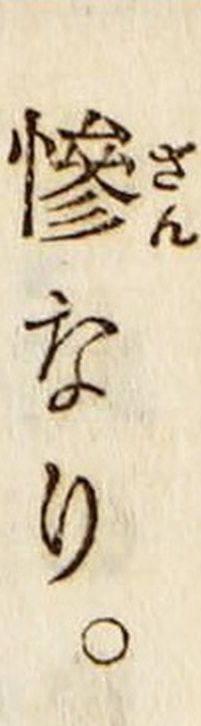惨なり。
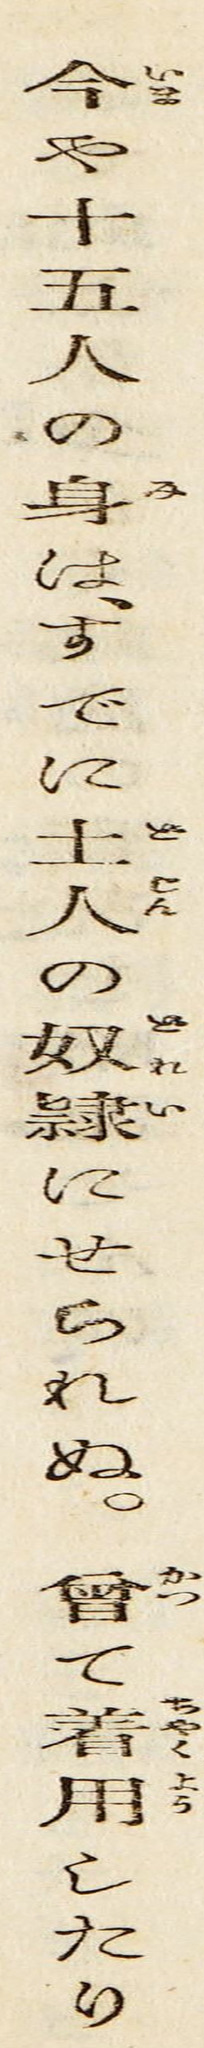今や十五人の身は、すでに土人の奴隷にせられぬ。曽て着用したり
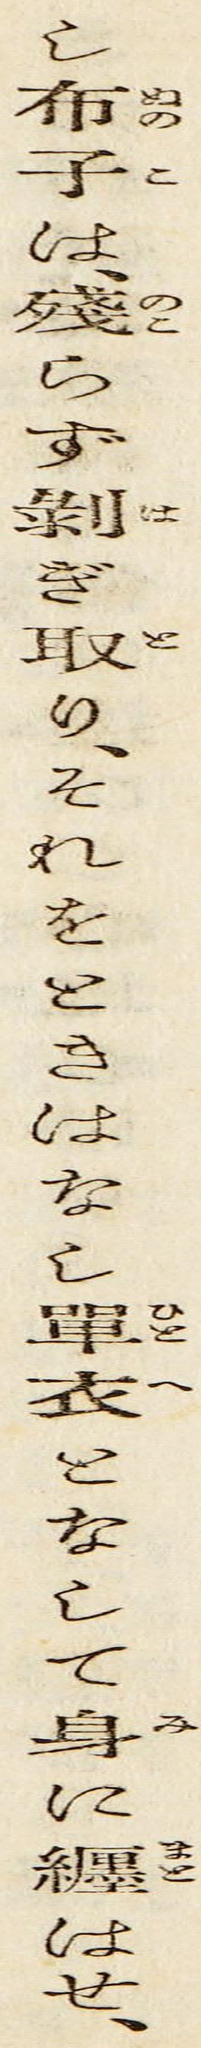し布子は、残らず剥ぎ取り、それをときはなし単衣となして身に纏はせ、
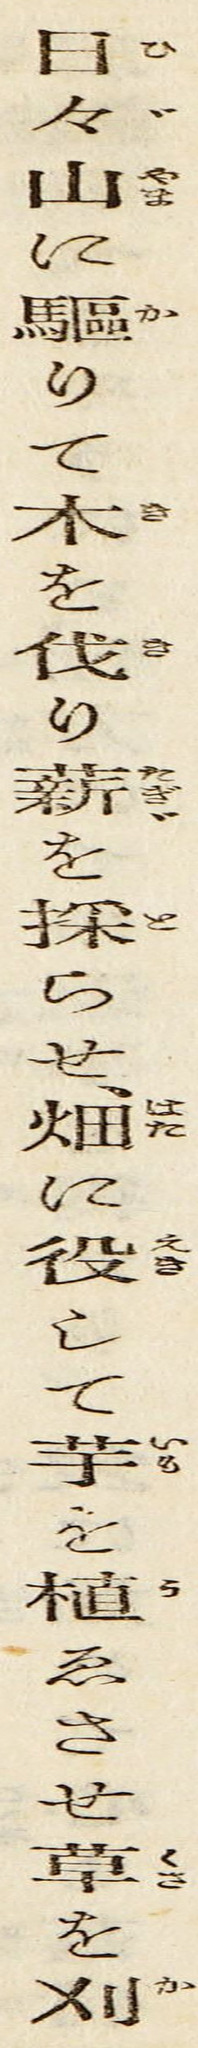日々山に駆りて木を伐り薪を採らせ、畑に役して芋を植ゑさせ草を刈
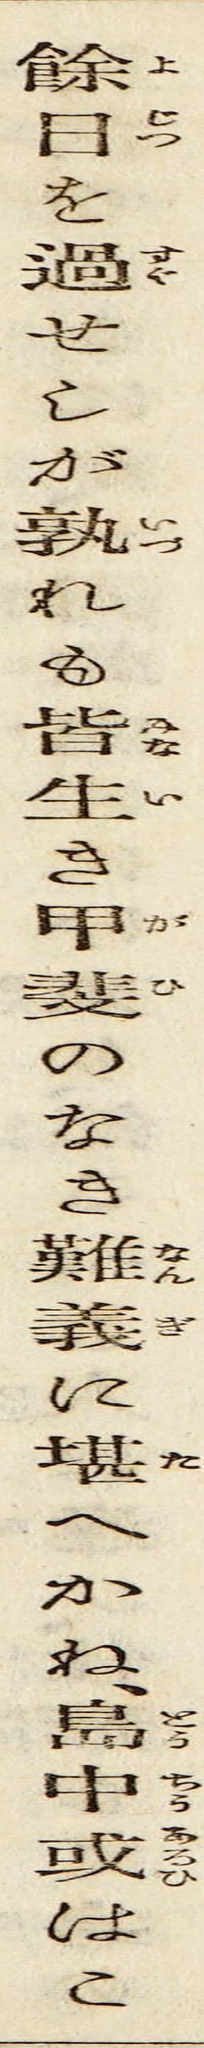余日を過せしが孰れも皆生き甲斐のなき難義に堪へかね、島中或はこ
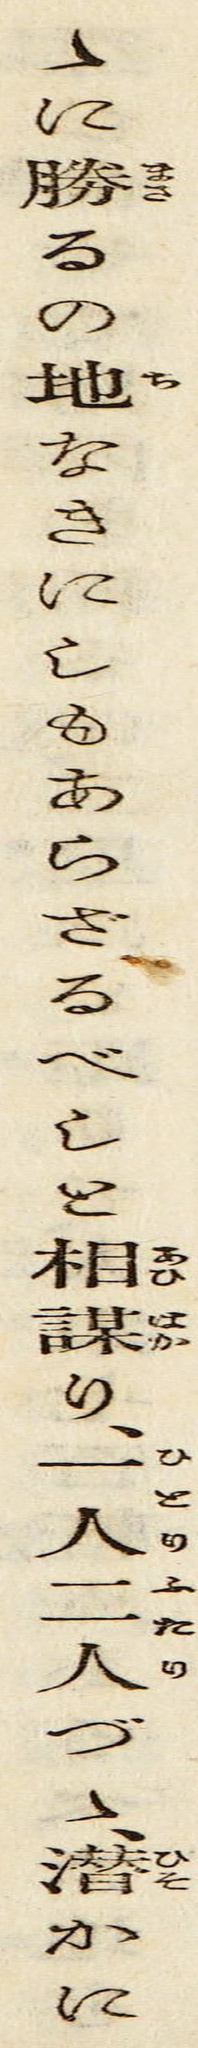ゝに勝るの地なきにしもあらざるべしと相謀り、一人二人づゝ、潜かに

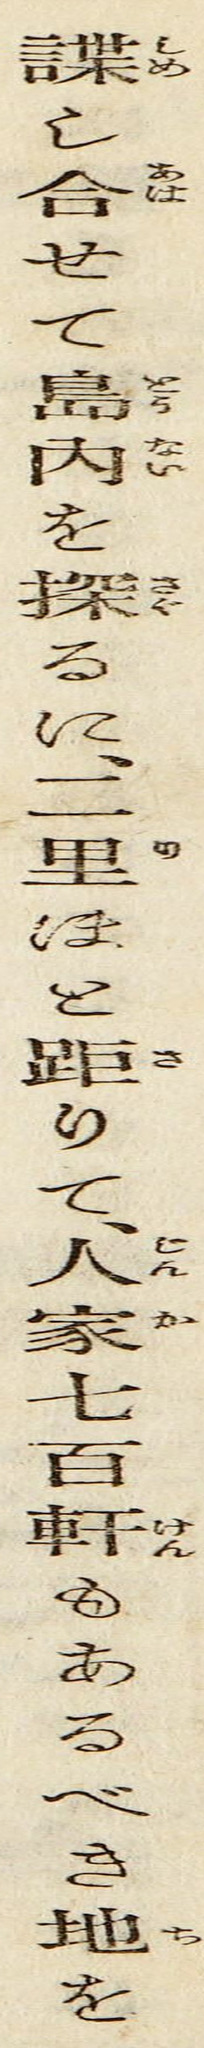諜し合せて島内を探るに、二里ほと距りて、人家七百軒もあるべき地を
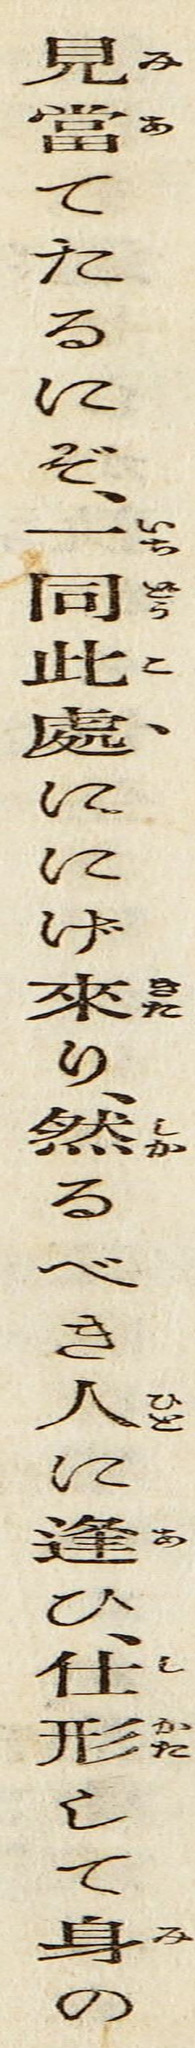見当てたるにぞ、一同此処ににげ来り、然るべき人に逢ひ、仕形して身の
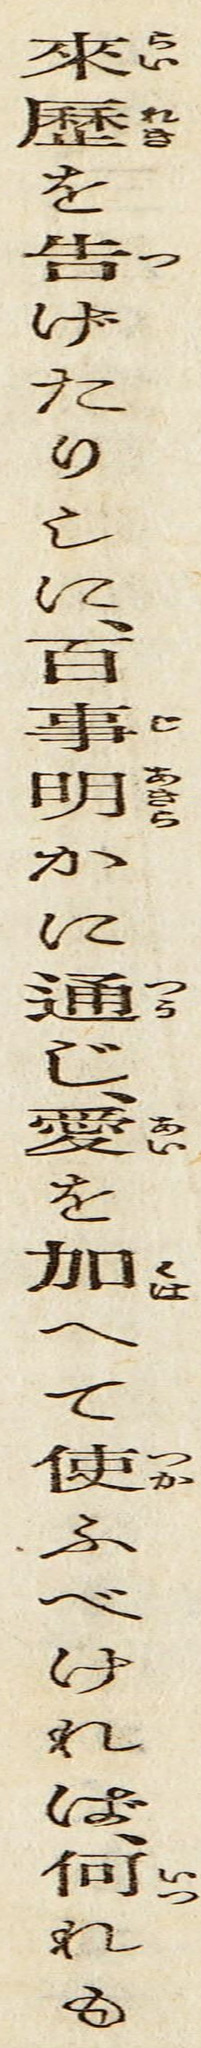来歴を告げたりしに、百事明かに通じ、愛を加へて使ふべければ、何れも
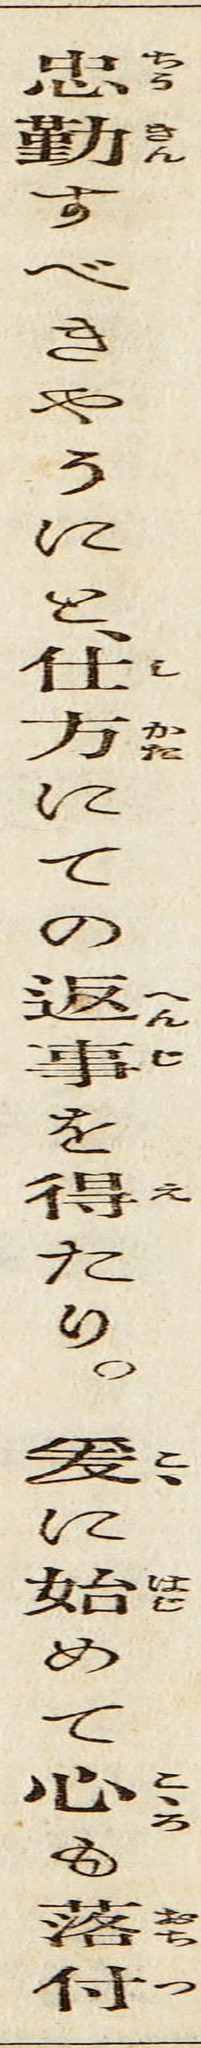忠勤すべきやうにと、仕方にての返事を得たり。爰に始めて心も落付
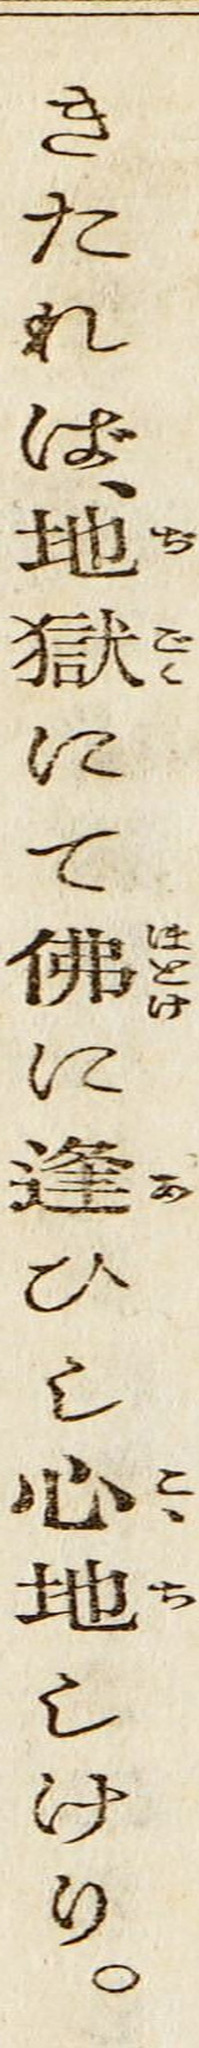きたれば、地獄にて仏に逢ひし心地しけり。
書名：日本漂流譚
